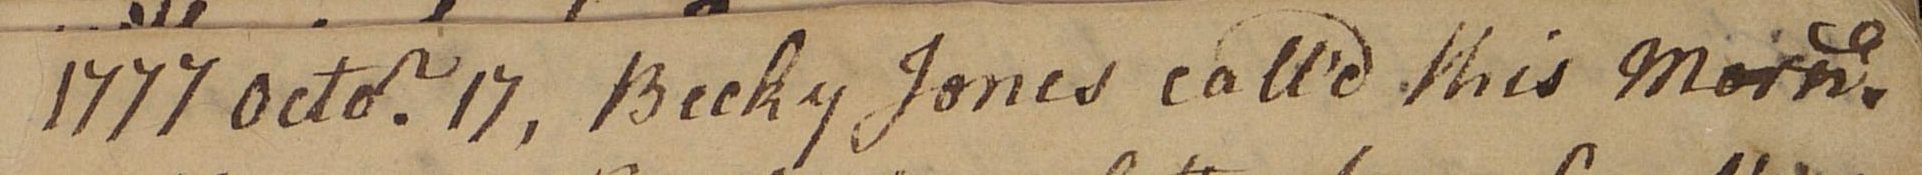1777 Octo^r. 17, Becky Jones call'd this Morn^g.
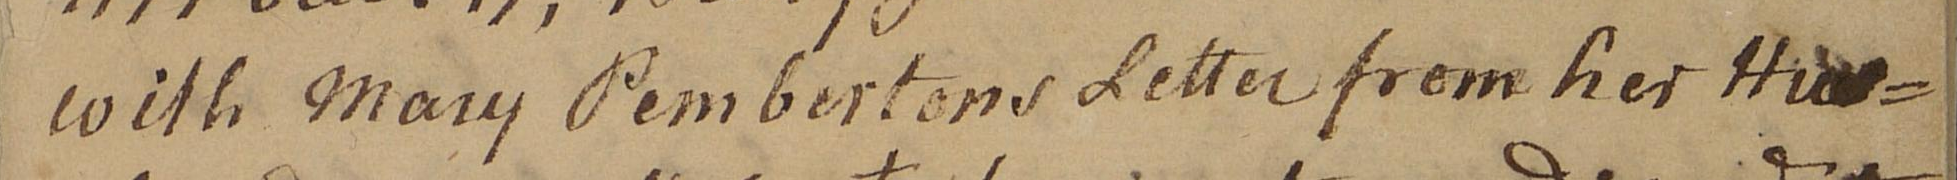with Mary Pembertons Letter from her Hus-
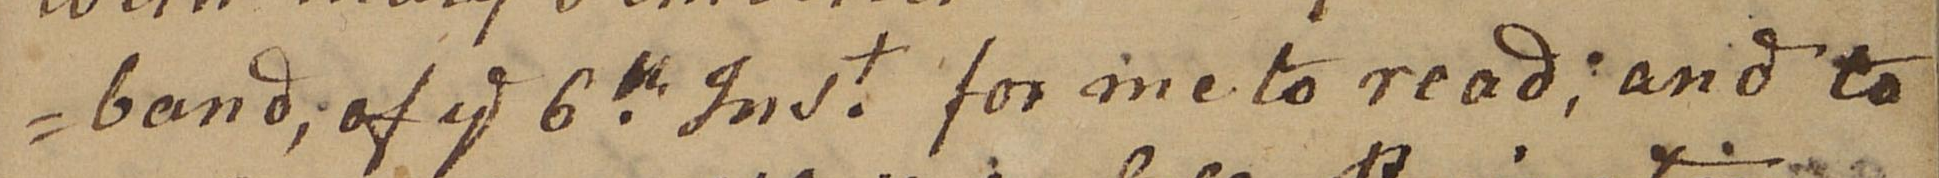-band; of y^e 6^th. Ins^t. for me to read; and to
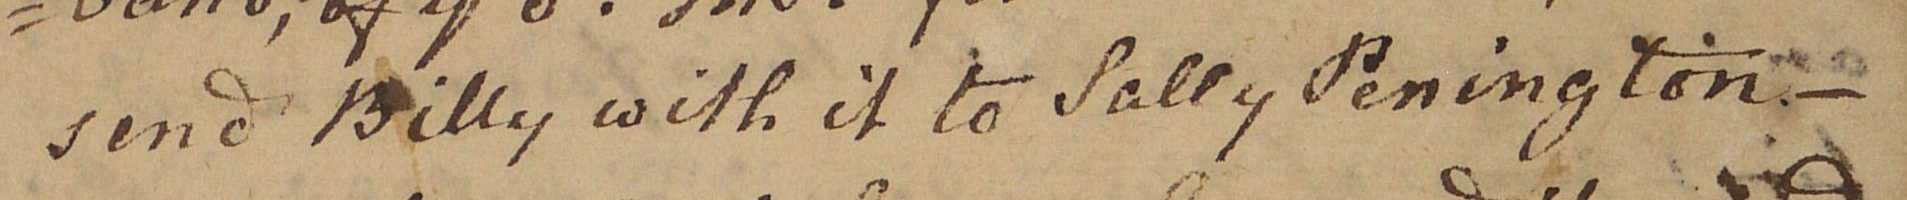send Billy with it to Sally Penington.-
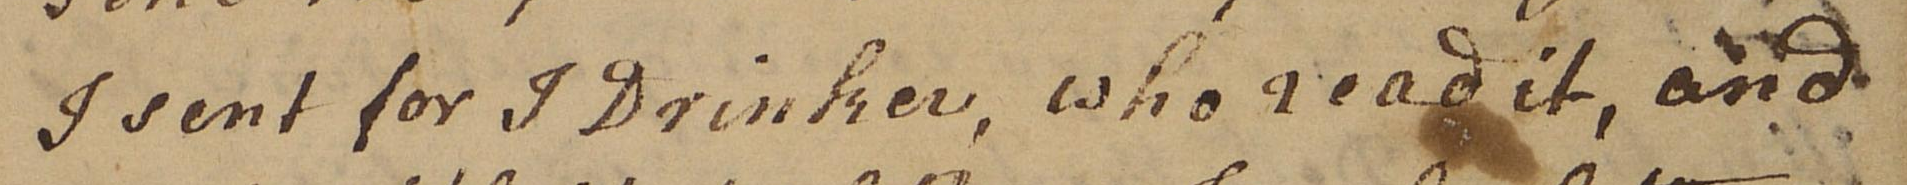I sent for I Drinker, who read it, and
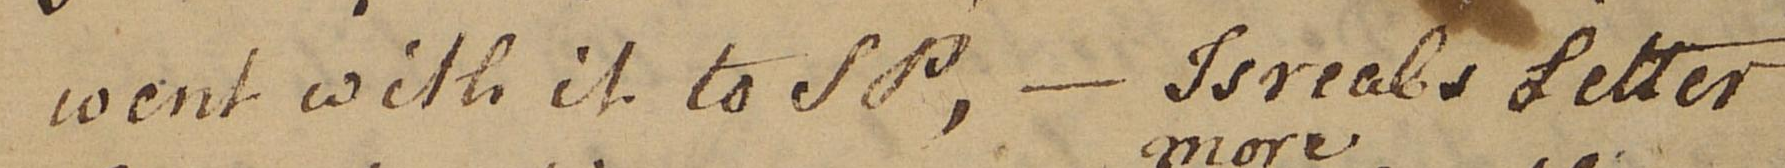went with it to SP.- Isreals Letter
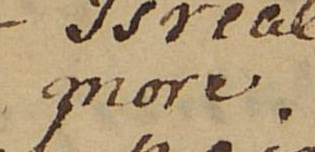more
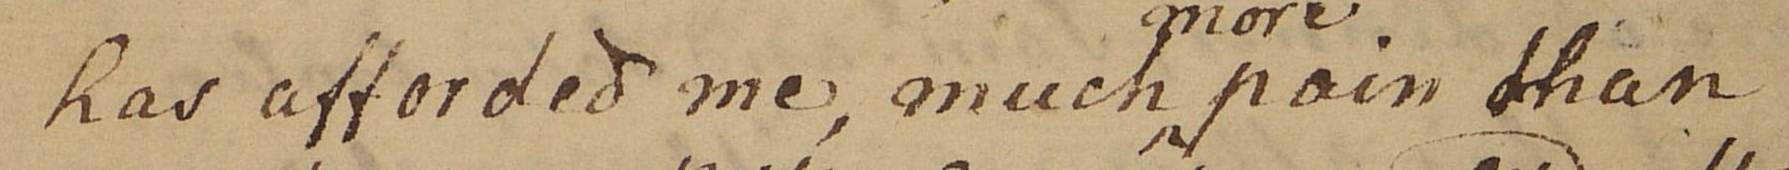has afforded me, much ^ pain than
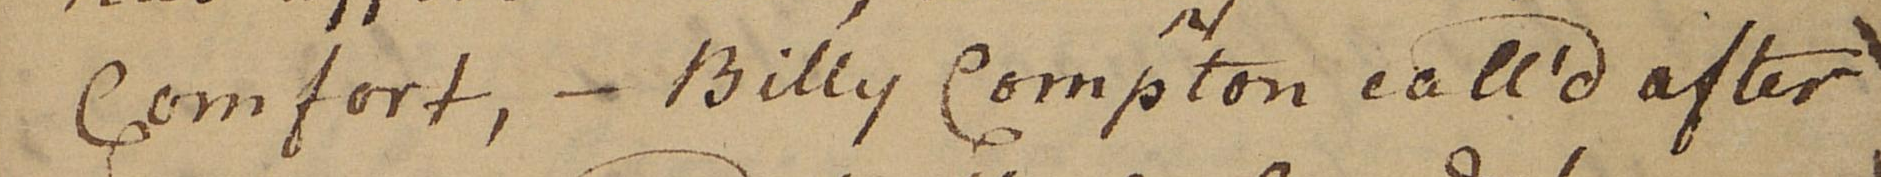Comfort,- Billy Compton call'd after
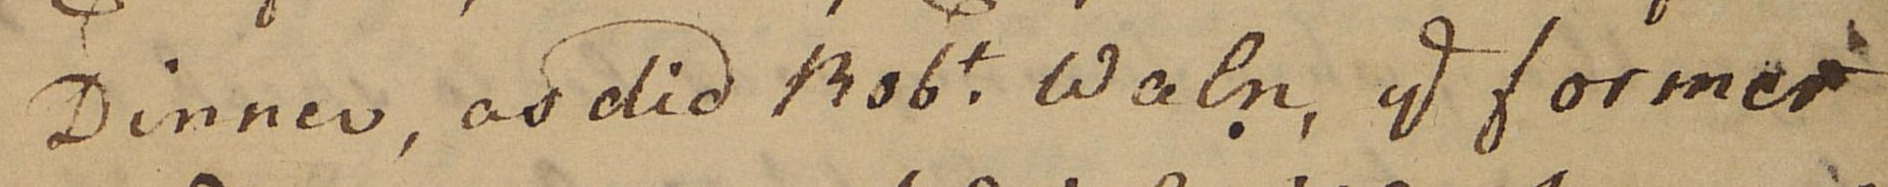Dinner, as did Rob^t. Waln, y^e former
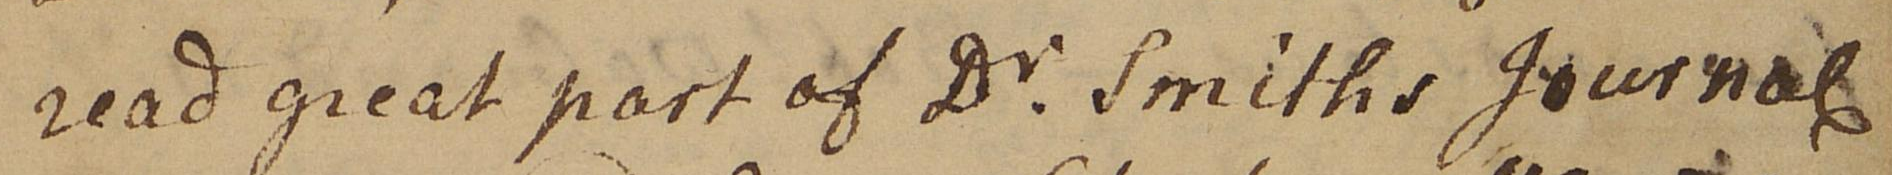read great part of D^r. Smiths Journal
